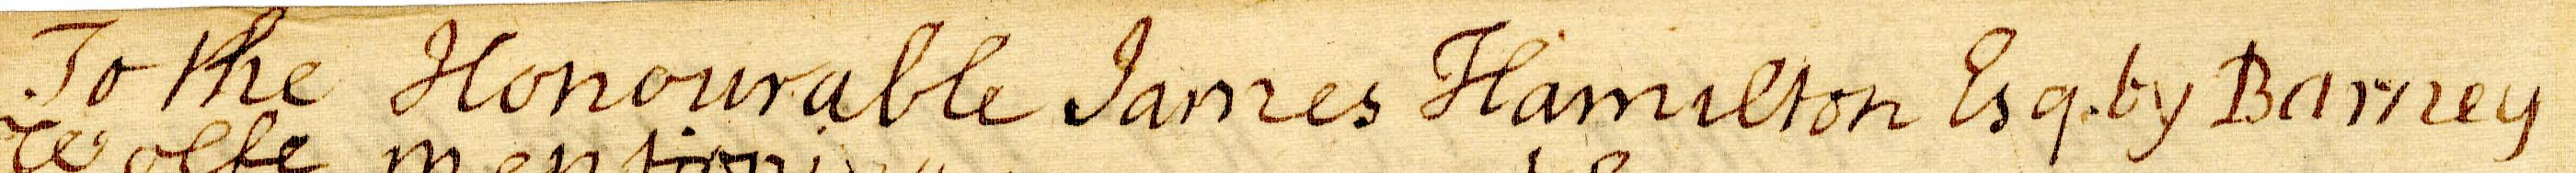To the Honourable James Hamilton Esq by Barney
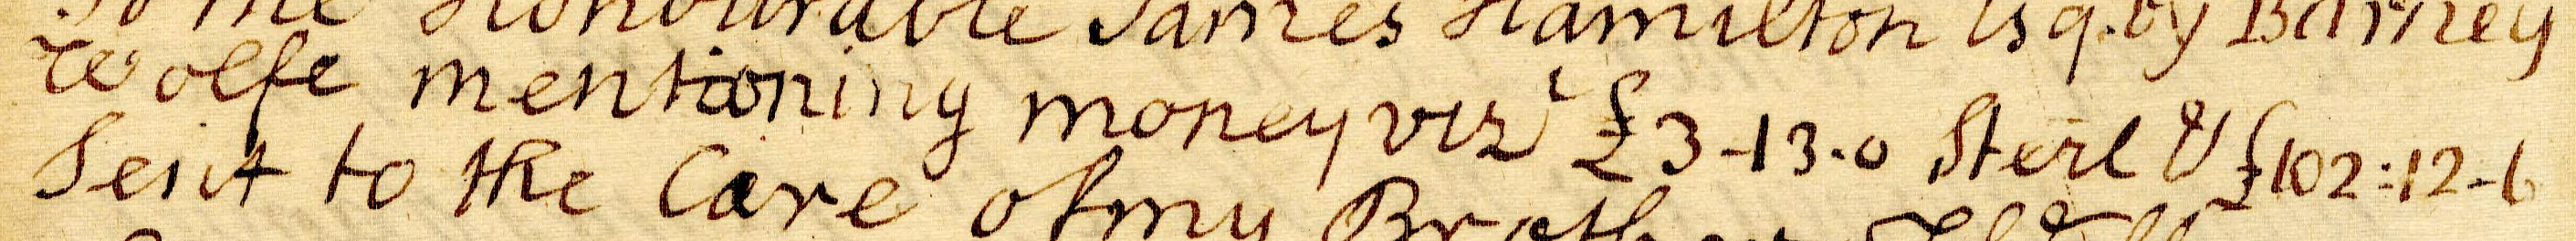Wolfe mentioning money viz^t £3.13.0 Sterl & £102..12.6
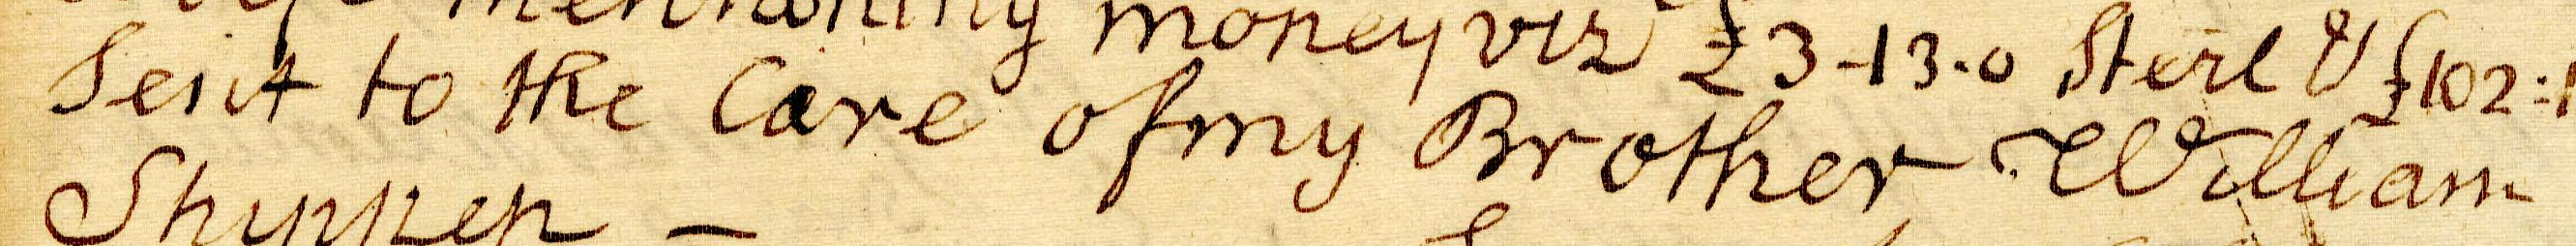Sent to the Care of my Brother William
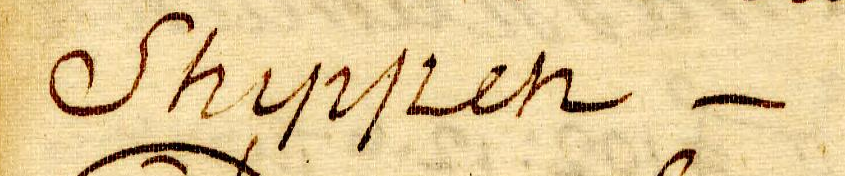Shippen-
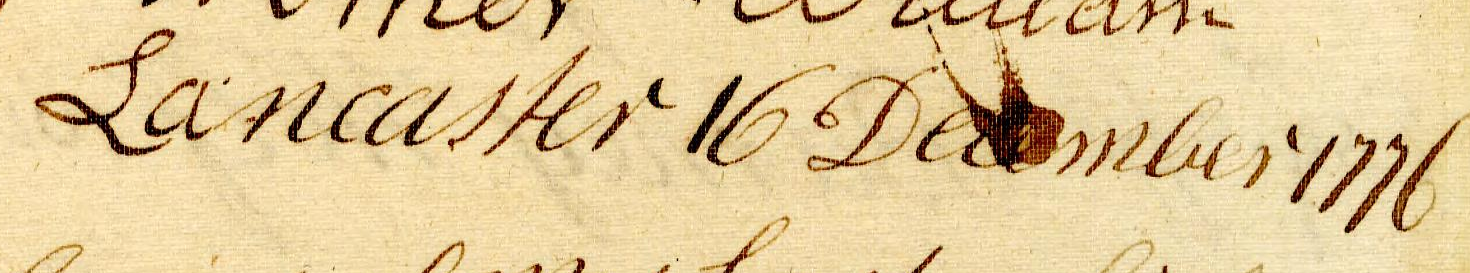Lancaster 16 December 1776
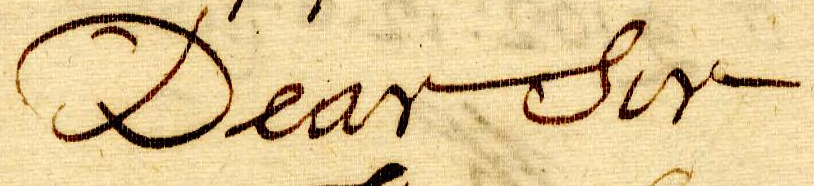Dear Sir
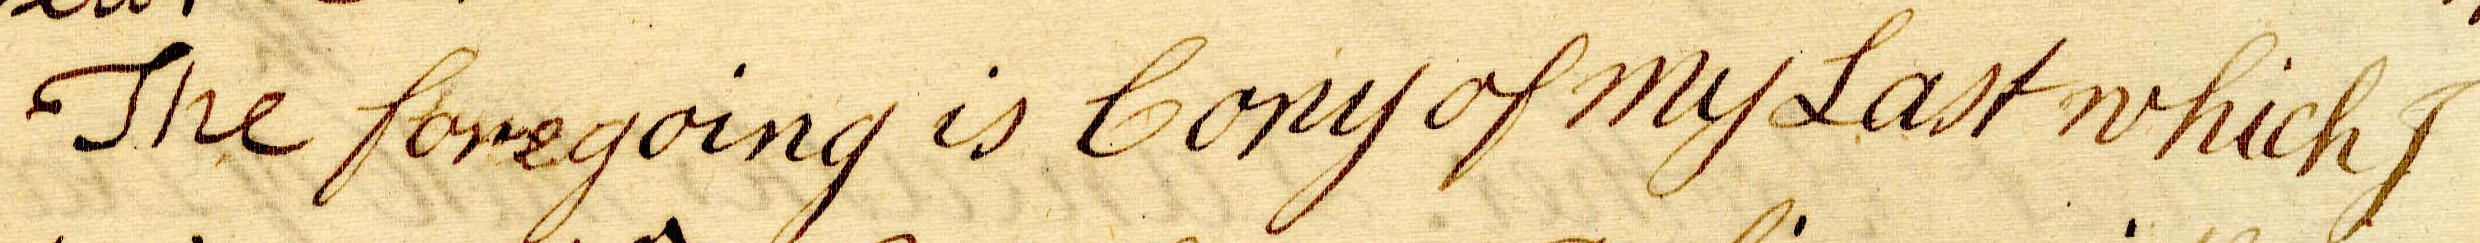The foregoing is Copy of my Last which I
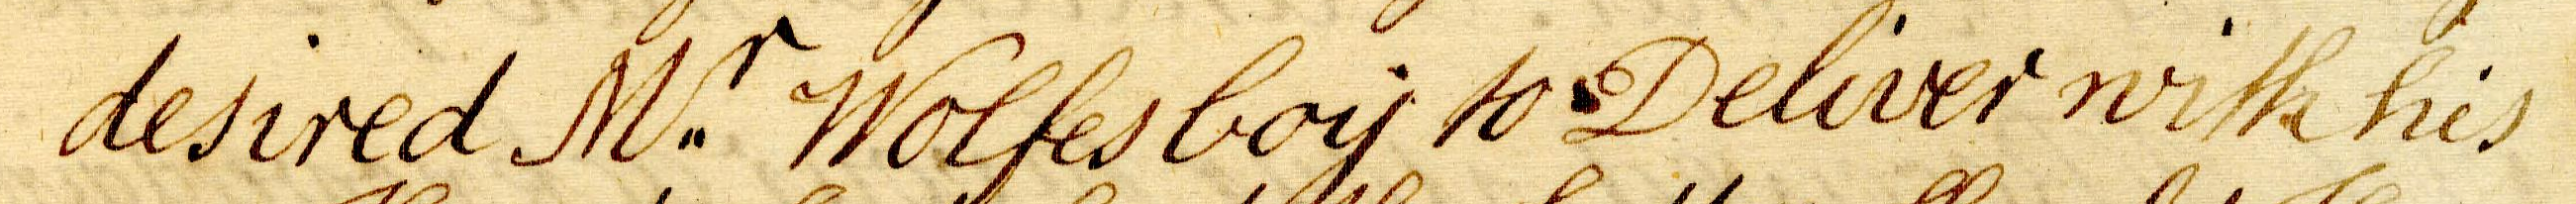desired M^r. Wolfes boy to Deliver with his
